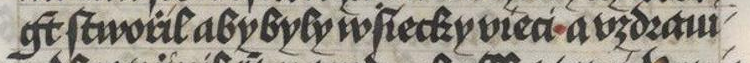ḡt ſtwoṙil aby byly wẛiecky víecí.a vzdraui¬
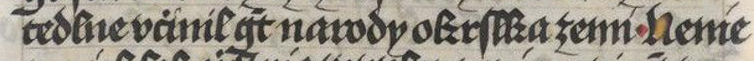tedlne vċiníl ḡt narody okrſlka zemí.Neníe
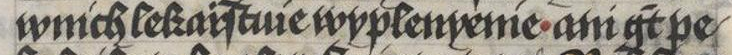wních lekaṙſtuíe wyplenyeníe.ani ḡt pe¬
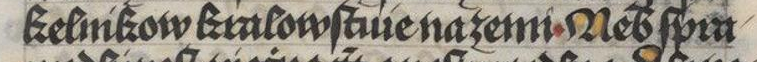kelníkow kralowſtuie na zemi.Neb ſpra¬
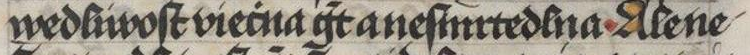wedliwoſt víeċna ḡt a neſmrtedlna.Ale ne¬
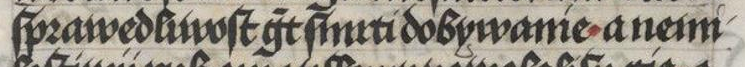ſprawedlíwoſt ḡt ſmrti dobywaníe.a nemi¬
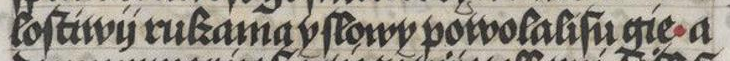loſtíwij rukama y ſlowy powolali ſu gíe.a
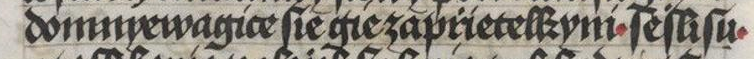domnyewagíce ſie gíe zapṙíetelkyní.ſeẛliſu.
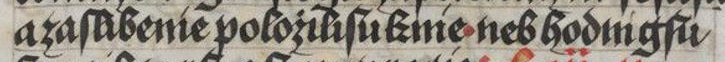azaſlíbeníe polożili ſu kníe.neb hodní gſu
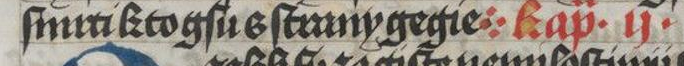ſmrti kto gſu s ſtrany gegíe: Kap̈. II.
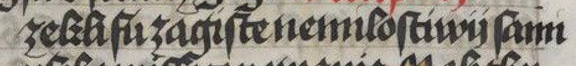zekli ſu zagiſte nemiloſtiwij ſami
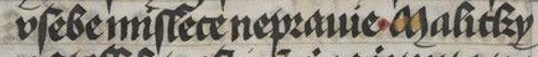vſebe miſlece neprauie.Malitky
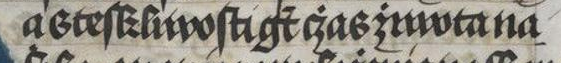a steſkliwoſti ḡt cżas żiwota na¬
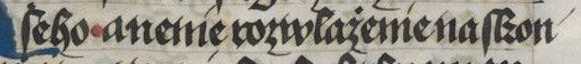ẛeho.a neníe rozwlażeníe naſkon¬
